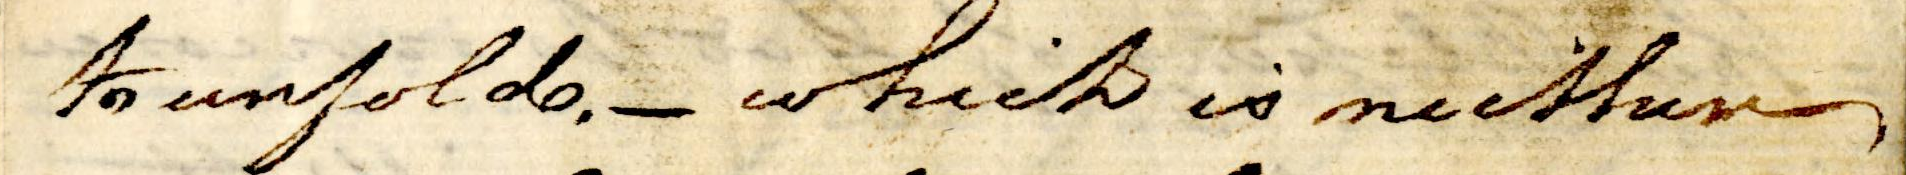to unfold.- which is neither
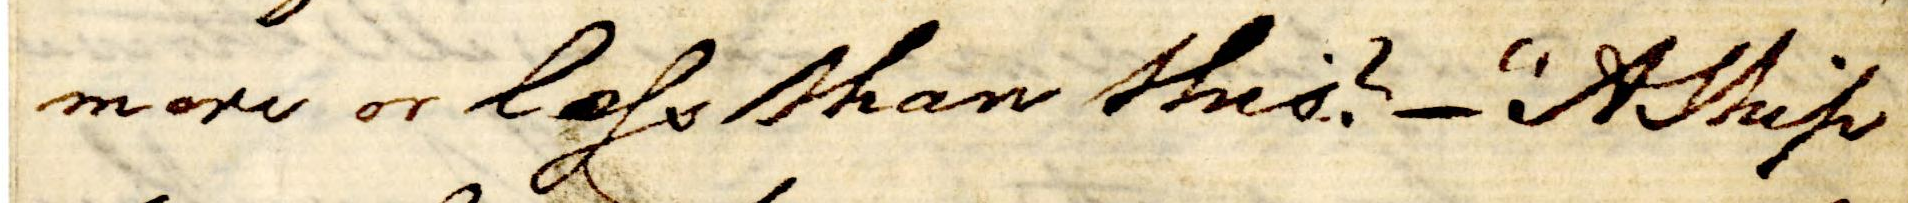more or less than this?- "A Ship
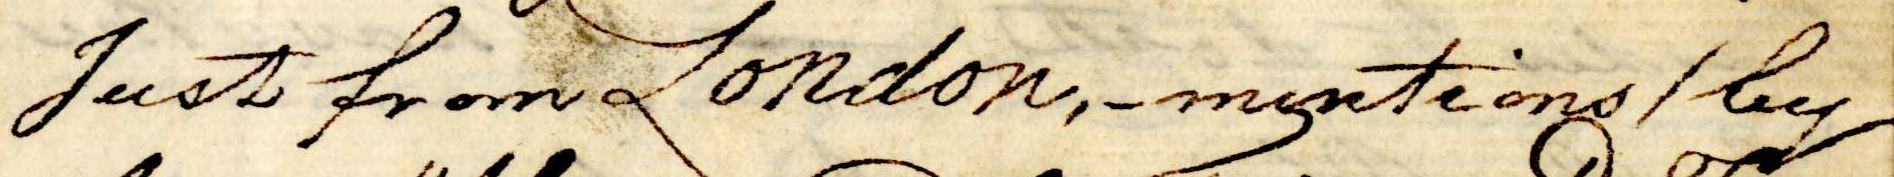Just from Lonon,- mentions /by
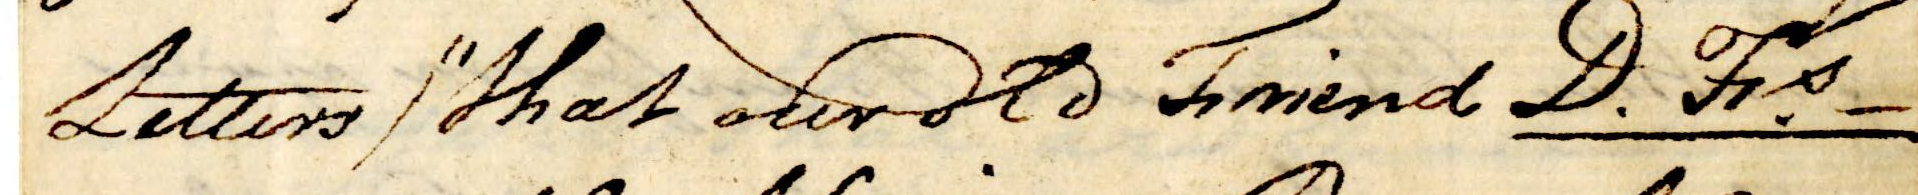Letters/ "that our old Friend D. Fr^s
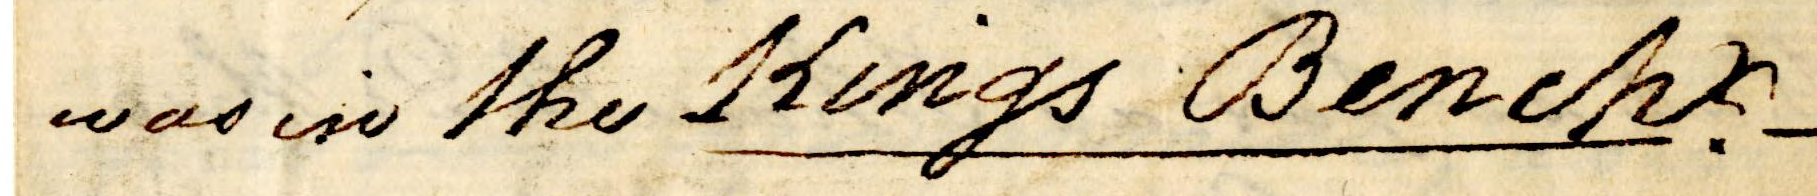was in the Kings Bench?-
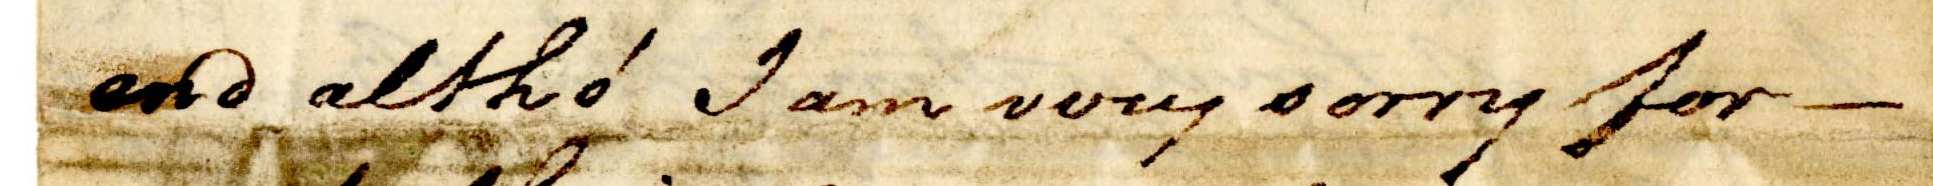and altho' I am very sorry for-
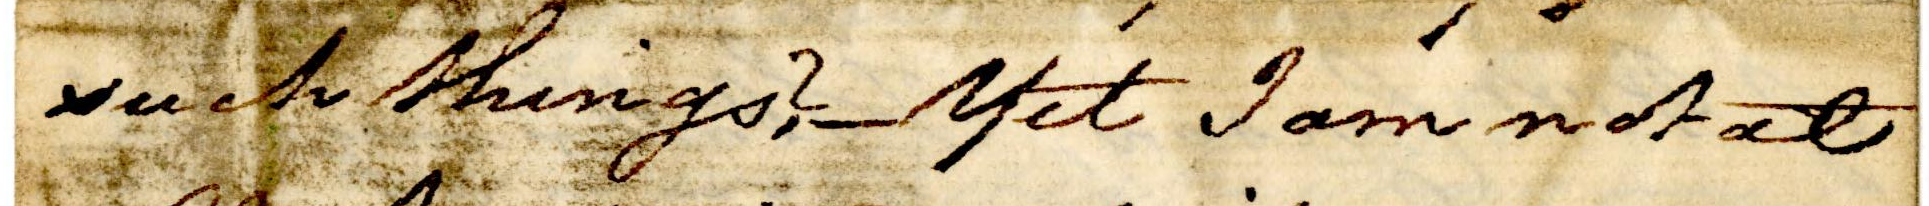such things?- Yet I am not at
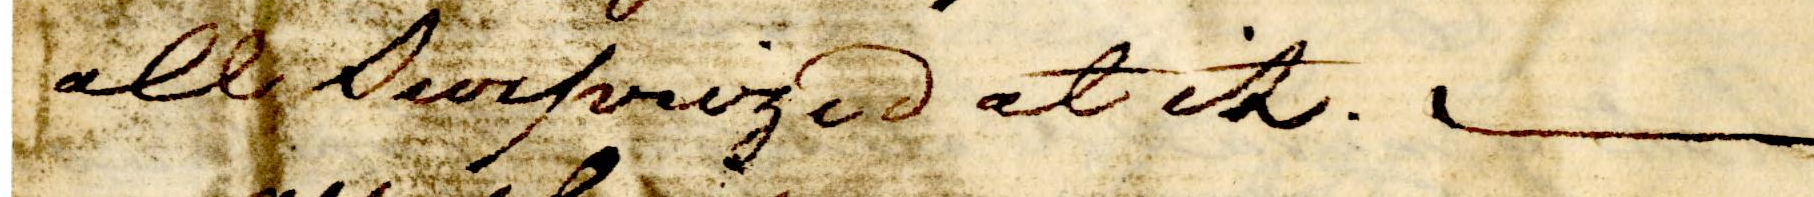all Surprized at it.-
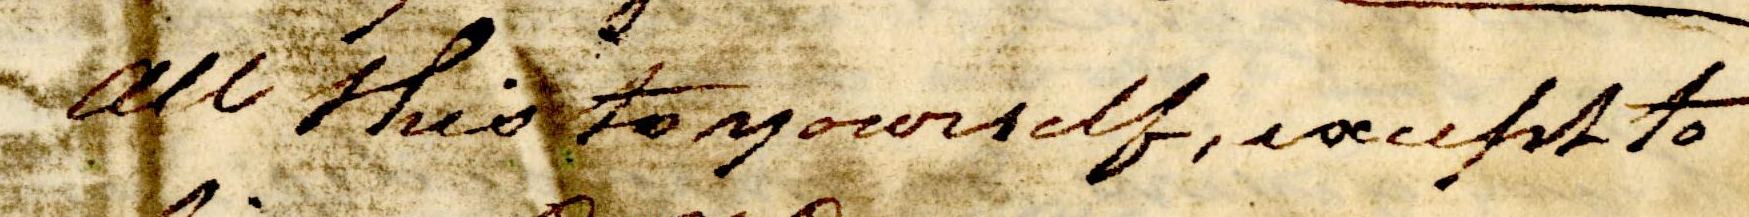All this to yourself, except to
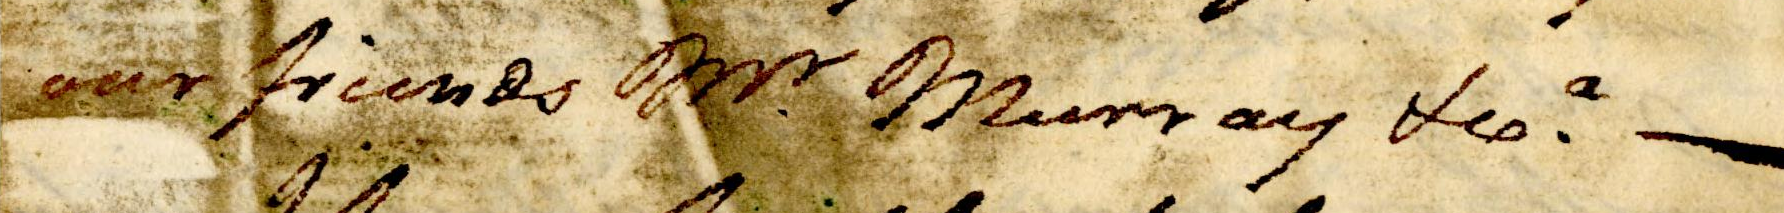our frieds M^r. Murray & &c^a.-
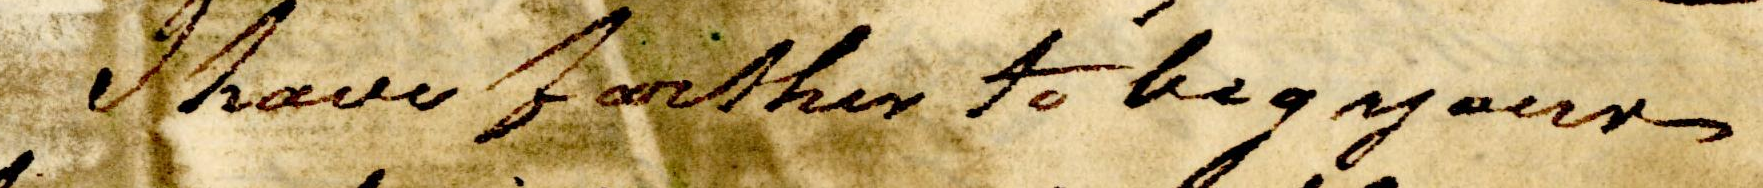I have farther to beg your
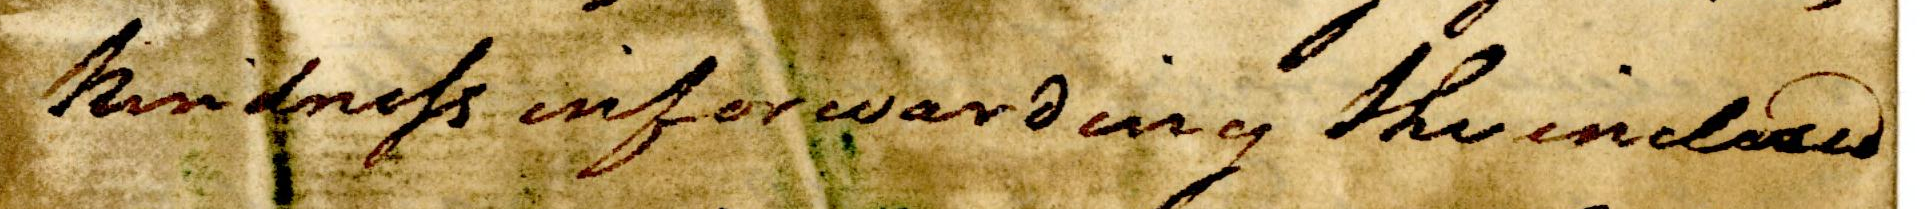kindness inforwarding the inclosed
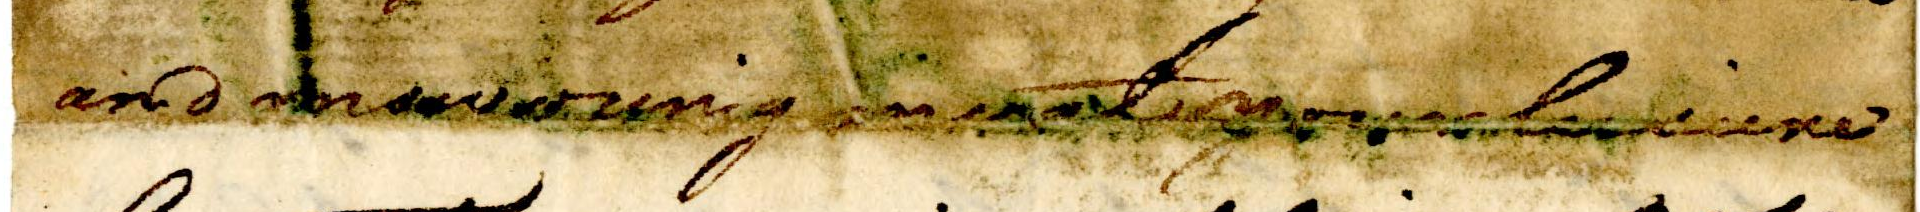and in sending [______________]
